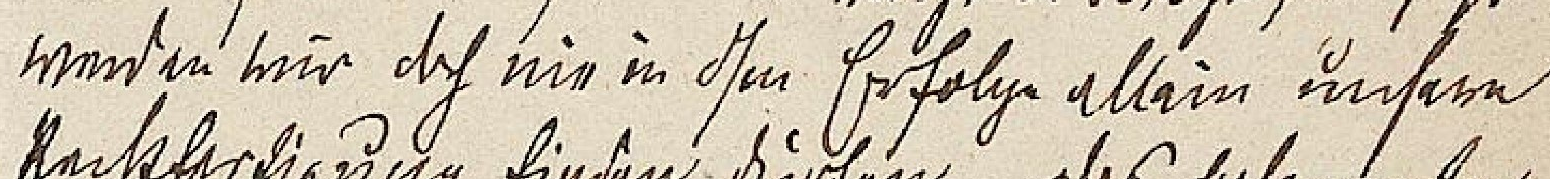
werden wir doch nie in dsm Erfolge allein unsere
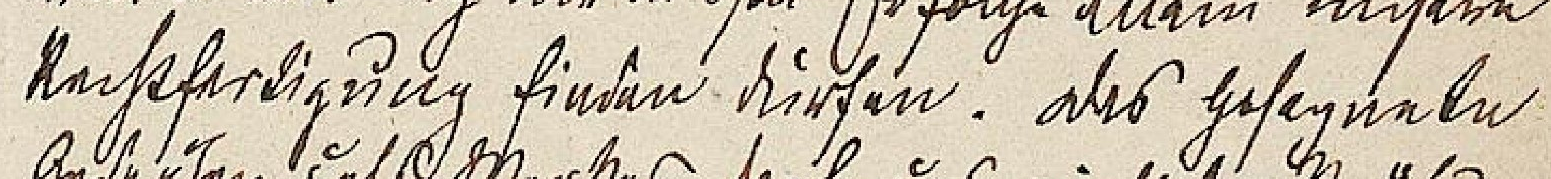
Rechtfertigung finden dürfen. Das Gesgnete
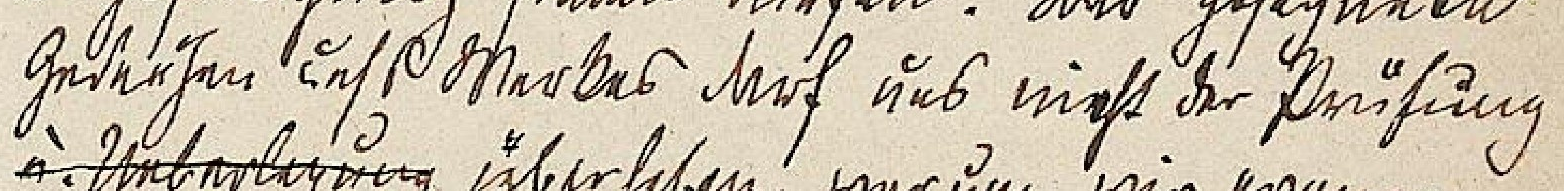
Gedeihen unss Werkes darf uns nicht der Prüfung
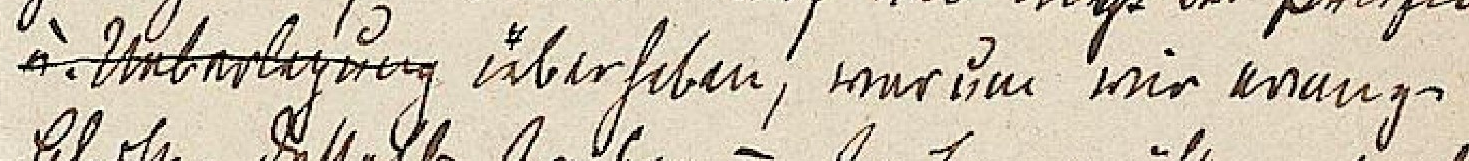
u. Ueberlegung überheben, warum wir evang.
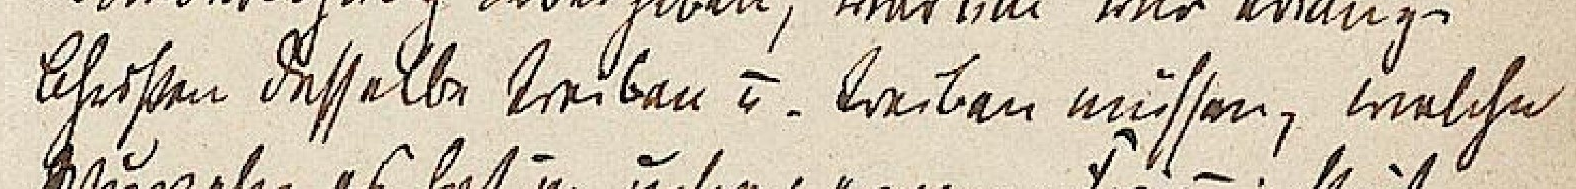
Christen dasselbe treiben u. treiben müssen, welche
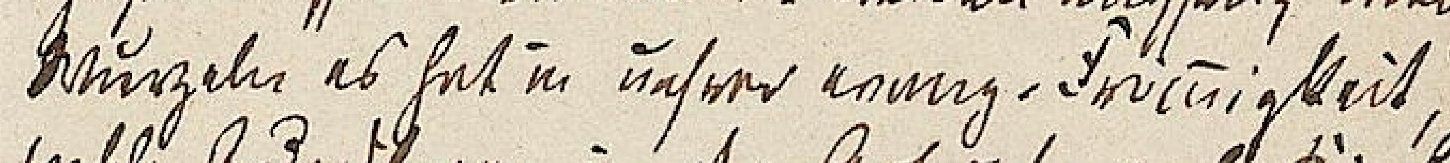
Wurzeln es hat in unserer evang. Frömigkeit
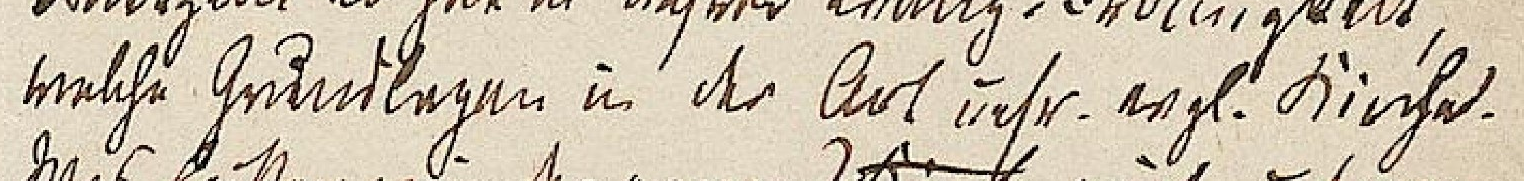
welche Grundlagen in der Art unsr. evgl. Kirche.
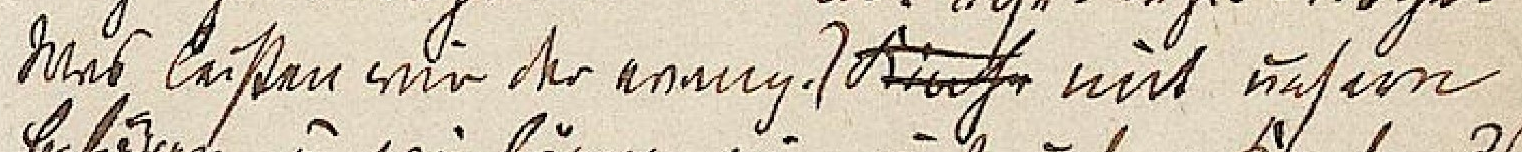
Das leisten wir der evang.] Kirche mit unsern
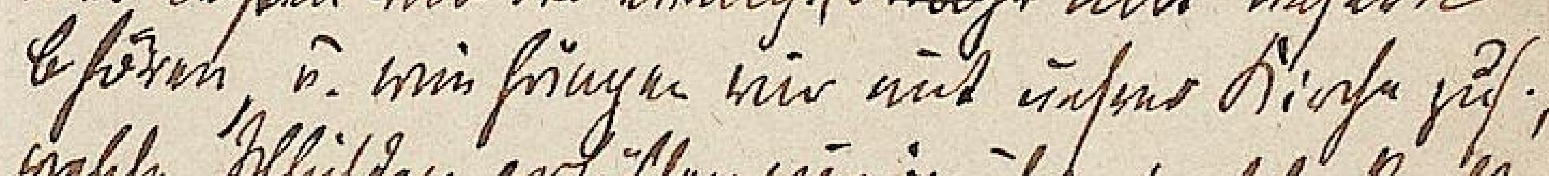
Chören, u. wie hängen wir mit unserer Kirche zus.
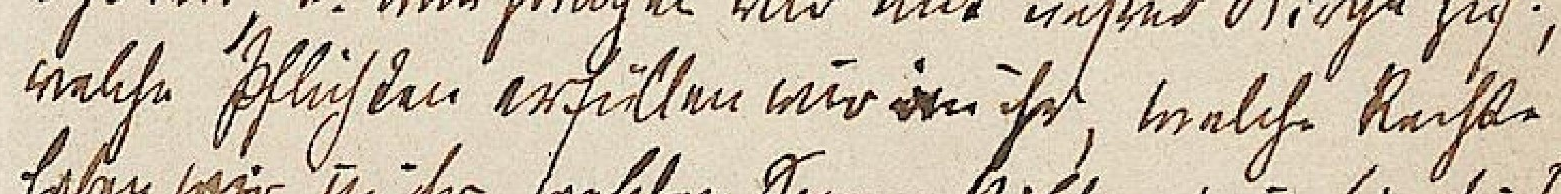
welche Pflichten erfüllen wir an ihr, welche Rechte
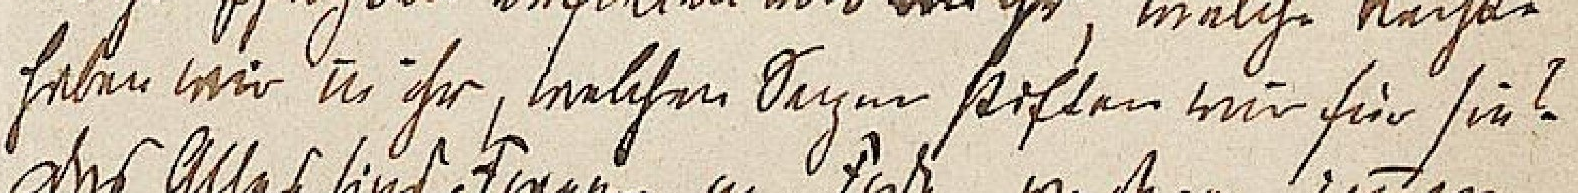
haben wir in ihr, welchen Segen stiften wir für sie?
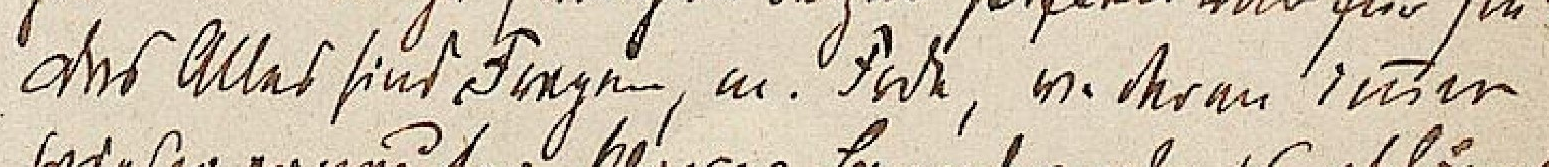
Das Alles sind Fragen, m. Frde, v. deren imer
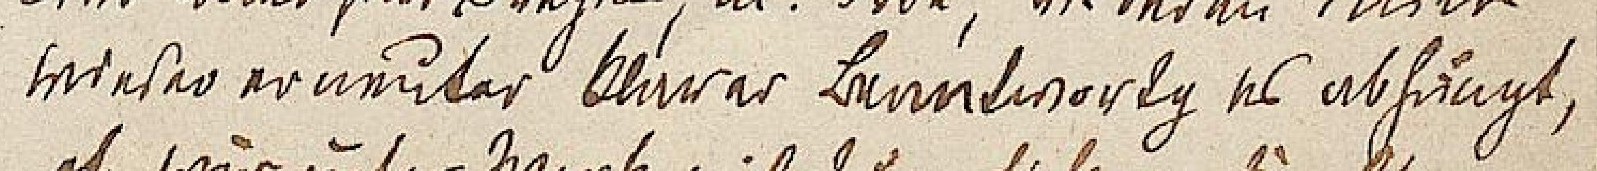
wieder erneuter klarer Beantwortg es abhängt,
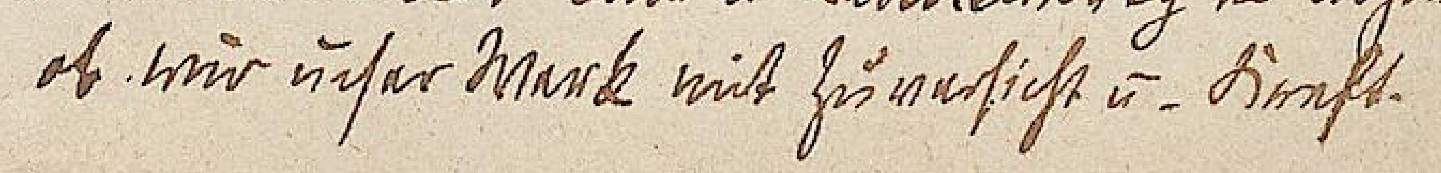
ob wir unser Werk mit Zuversicht u. Kraft
